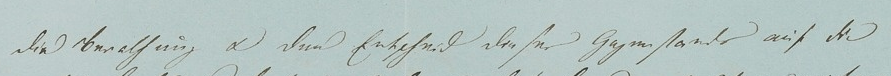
die Berathung u den Entscheid dieses Gegenstand auf die
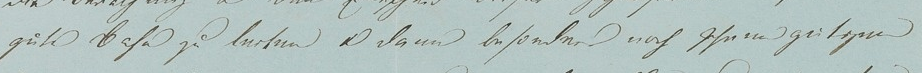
gute Bahn zu leiten u dann besonders Ihren gütigen
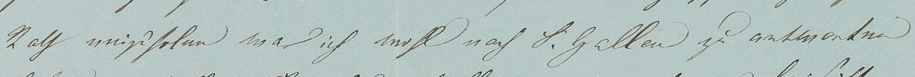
Rath einzuholen was ich wohl nach St. Gallen zu antworten
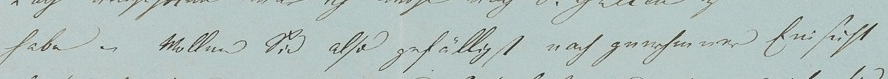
habe. Wollen Sie also gefälligst nach genohmner Einsicht
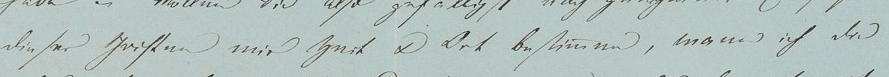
dieser Schriften mir Zeit u Ort bestimmt, wann ich die
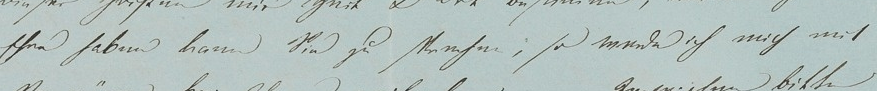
Ehre haben kann Sie zu sprechen, so werde ich mich mit
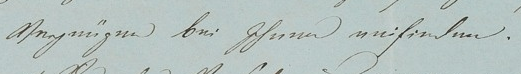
Vergnügen bei Ihnen einfinden.
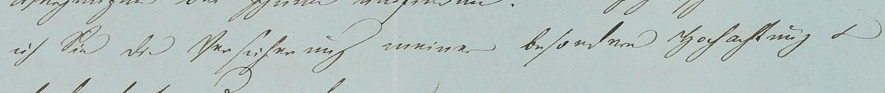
ich Sie die Versicherung meiner besondern Hochachtung u
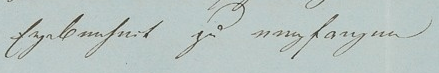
Ergebenheit zu empfangen
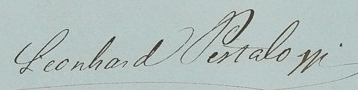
Leonhard Pestalozzi
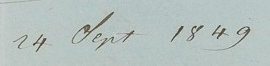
24 Sept 1849
